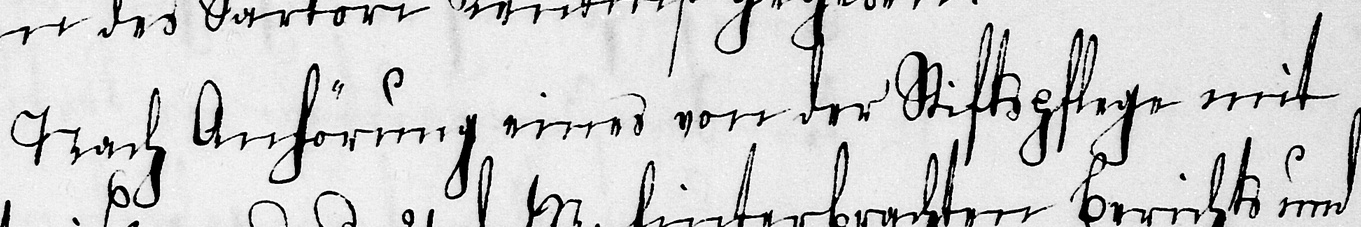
Nach Anhörung eines vom der Stiftspflege mit
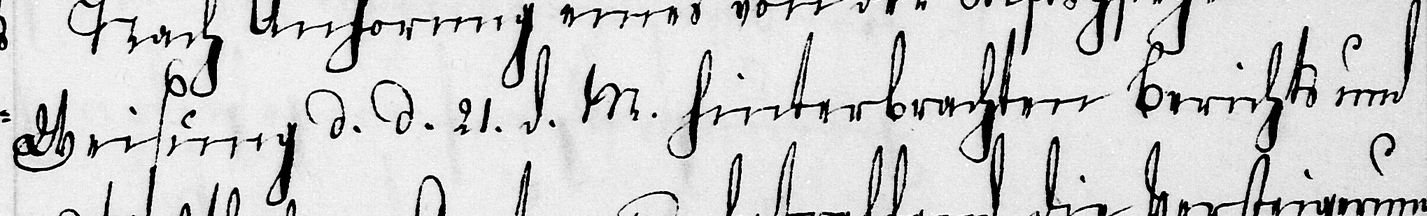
Weisung d. d. 21. d. M. hinterbrachten Berichts und
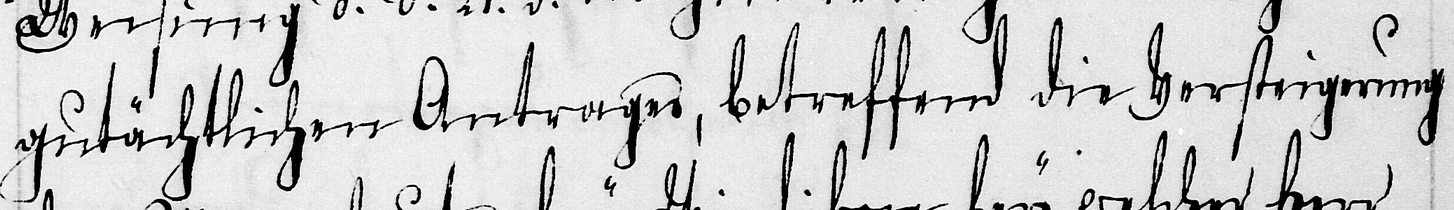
gutächtlichen Antrages, betreffend die Versteigerung
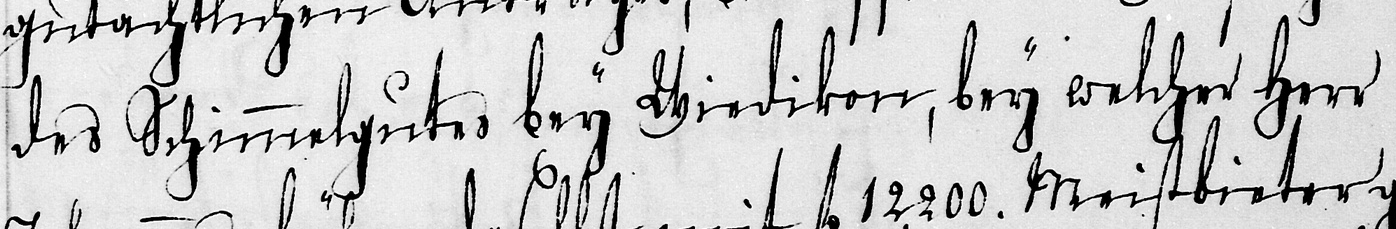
des Schimmelgutes bey Wiedikon, bey welcher Herr
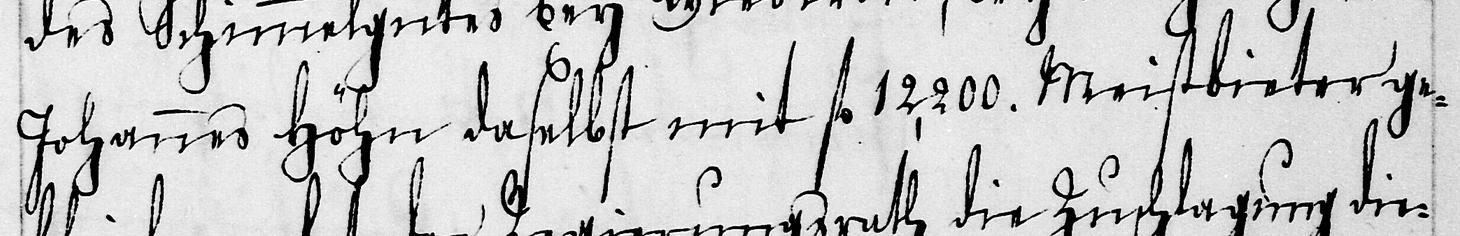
Johannes Höhn daselbst mit fl. 12,200. Meistbieter ge¬
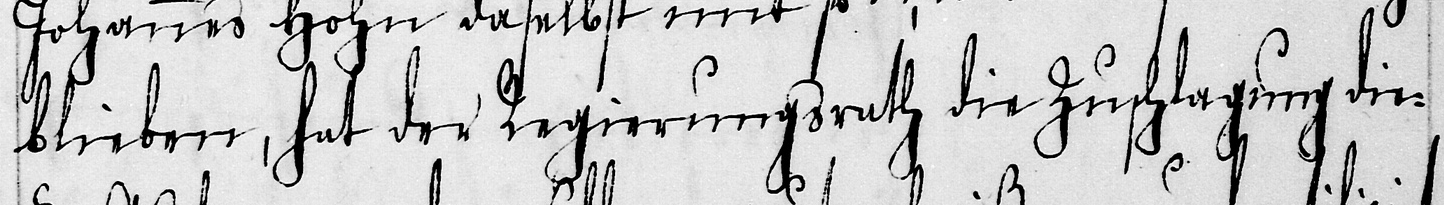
blieben, hat der Regierungsrath die Zuschlagung die¬
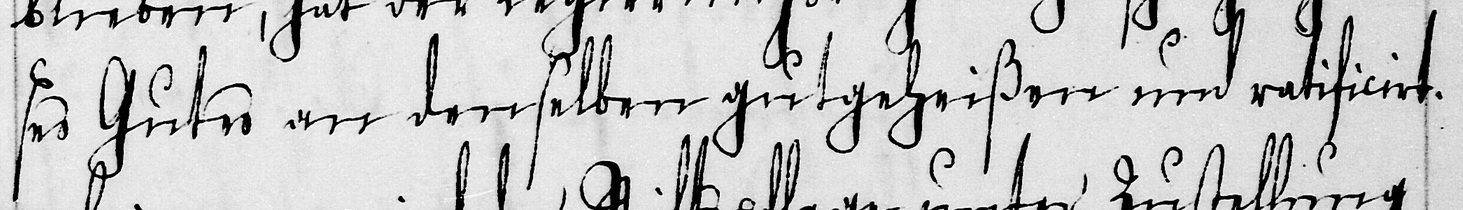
ses Gutes an denselben gutgeheißen und ratificirt.
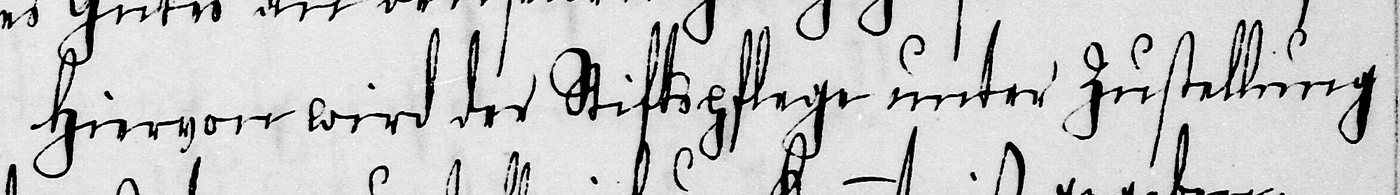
Hiervon wird der Stiftspflege unter Zustellung
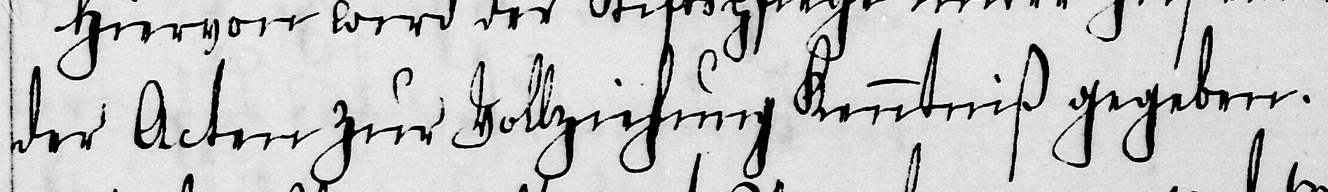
der Acten zur Vollziehung Kenntniß gegeben.
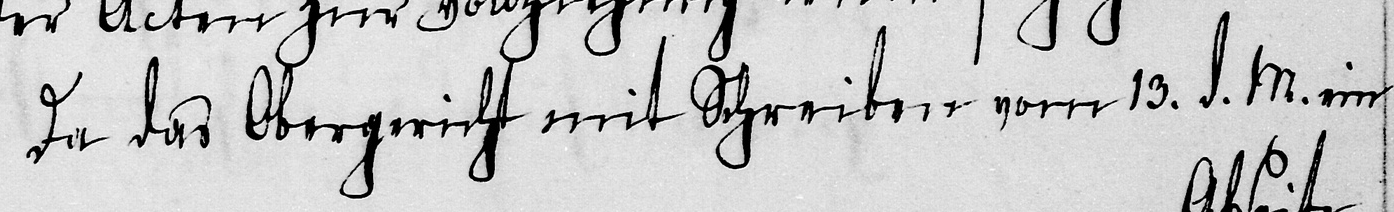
Da das Obergericht mit Schreiben vom 13. d. M. ein
